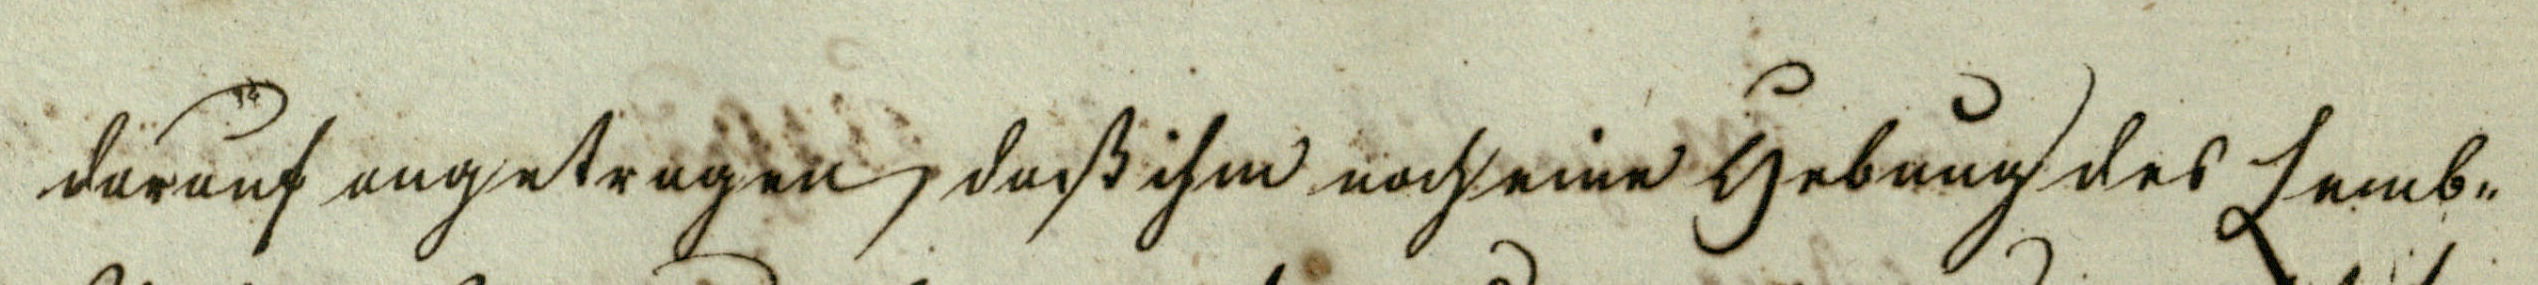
darauf angetragen, daß ihm noch eine Hebung des Lemb¬
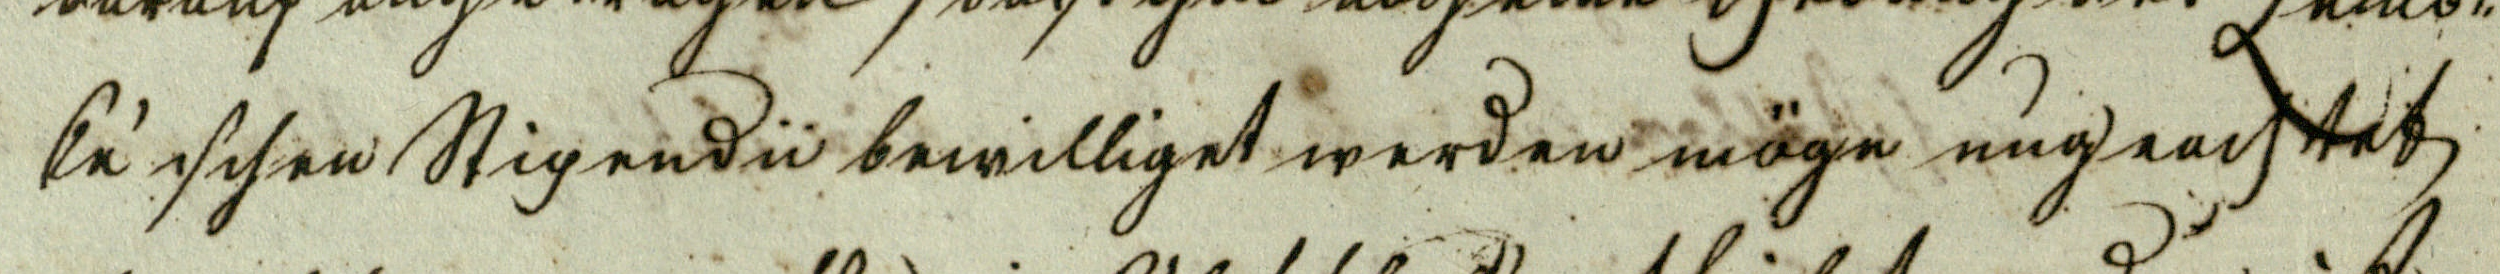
ke'schen Stipendii bewilliget werden möge ungeachtet,
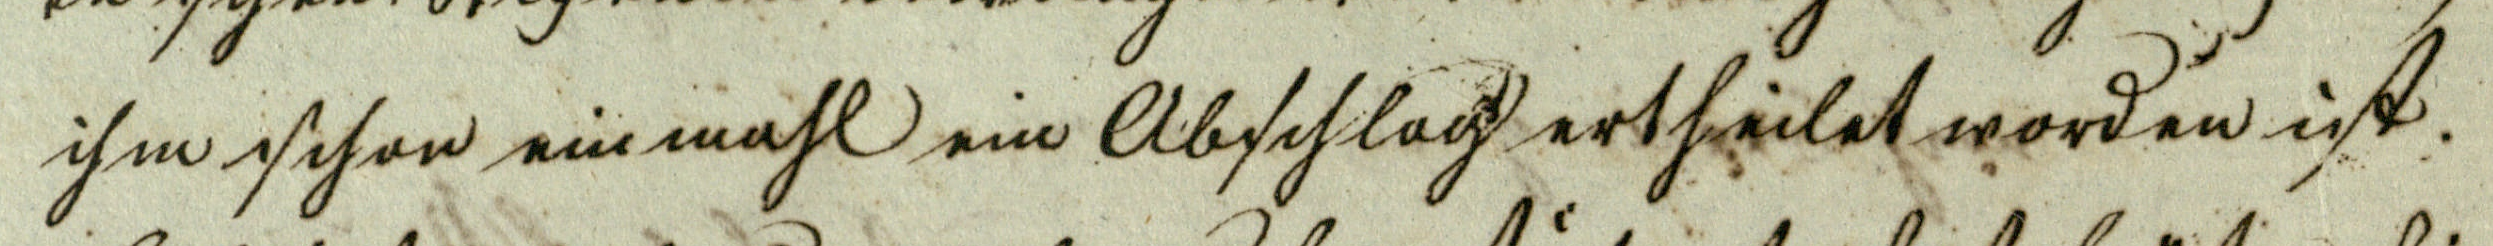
ihm schon einmahl ein Abschlag ertheilet worden ist.
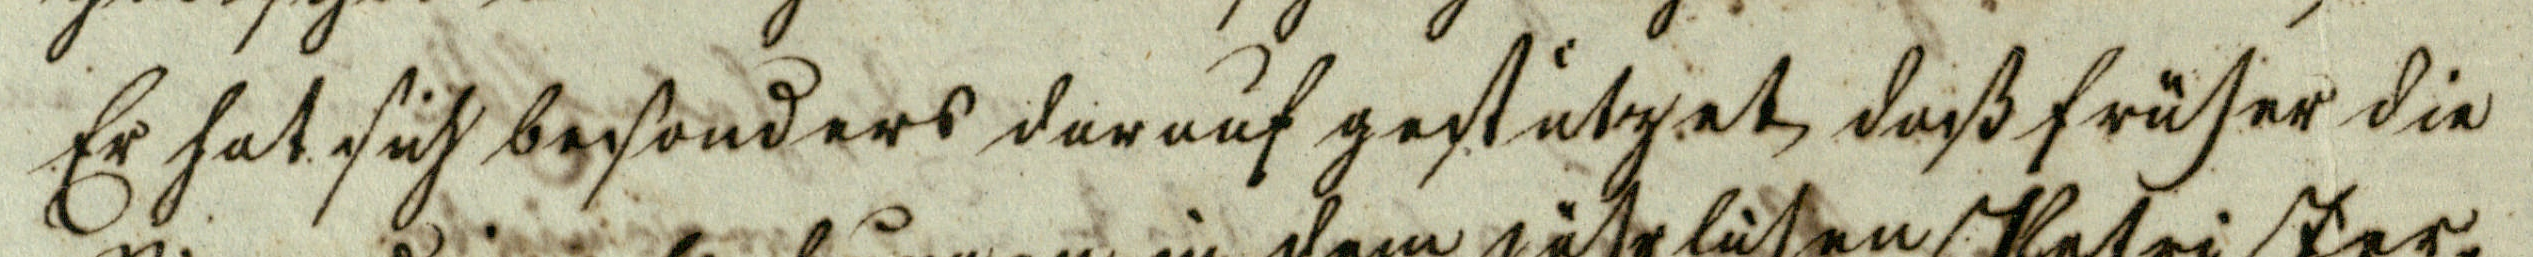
Er hat sich besonders darauf gestützet, daß früher die
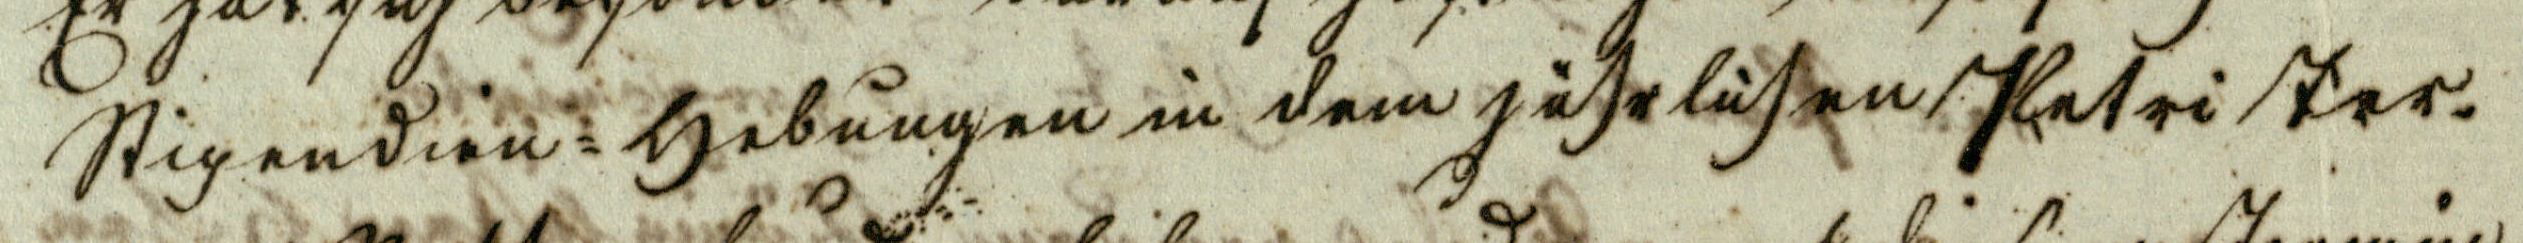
Stipendien-Hebungen in dem jährlichen Petri Ter¬
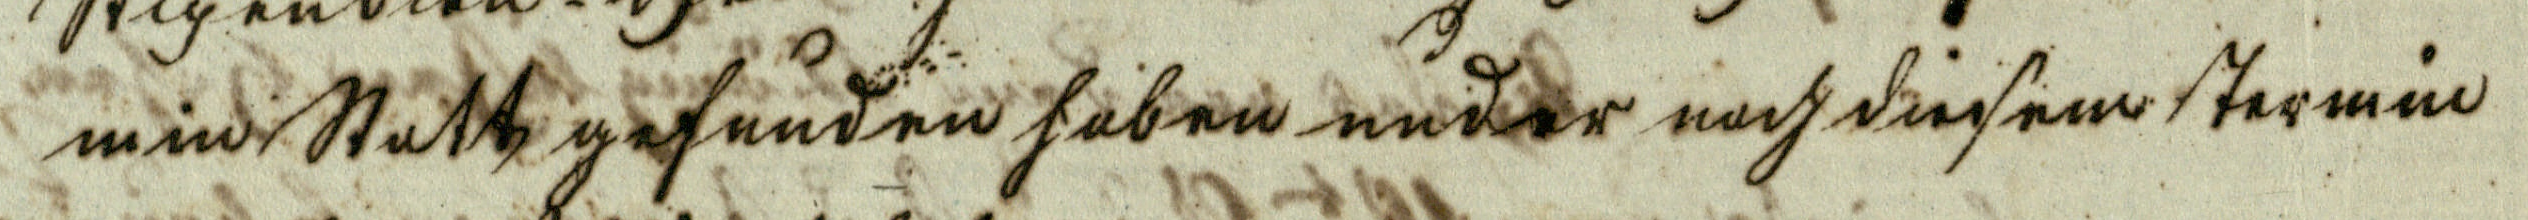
min Statt gefunden haben und er nach diesem Termin
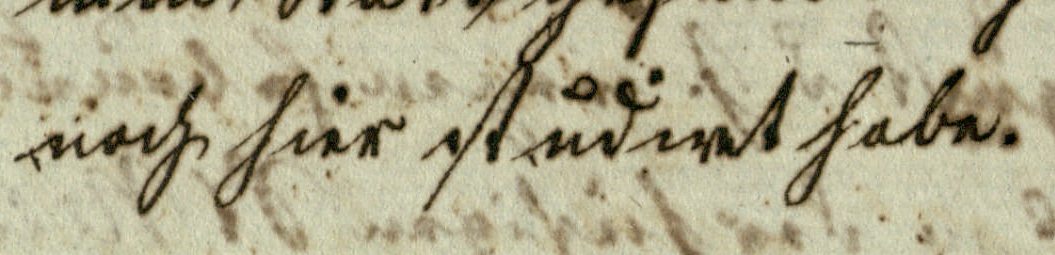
noch hierr studiret habe.
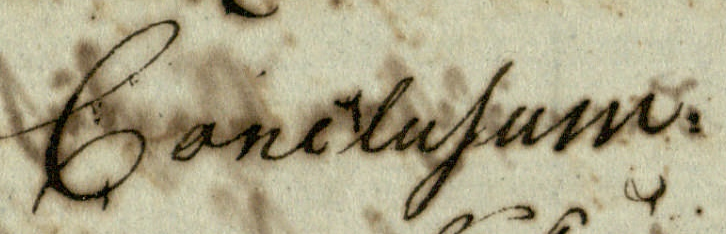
Conclusum:
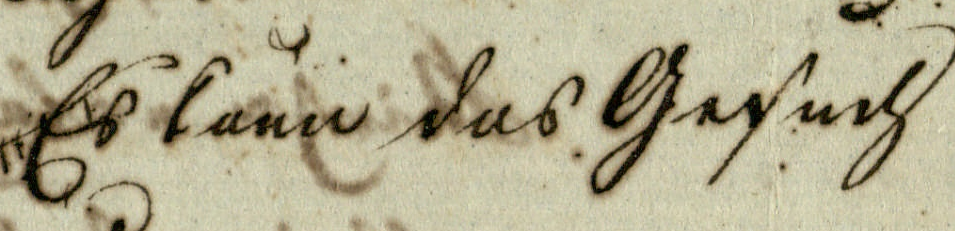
Es kann das Gesuch
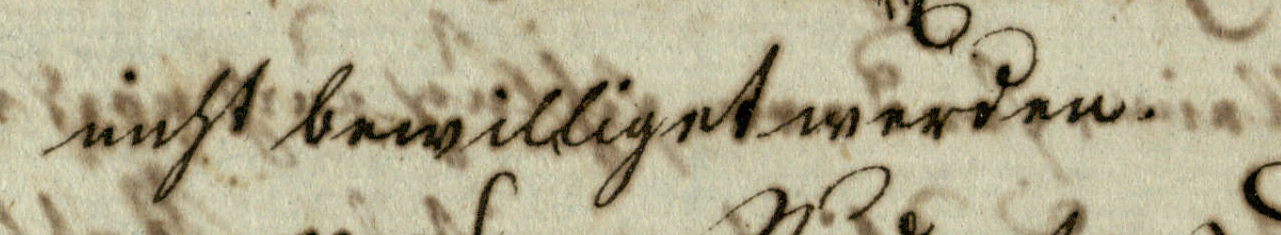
nicht bewilliget werden.
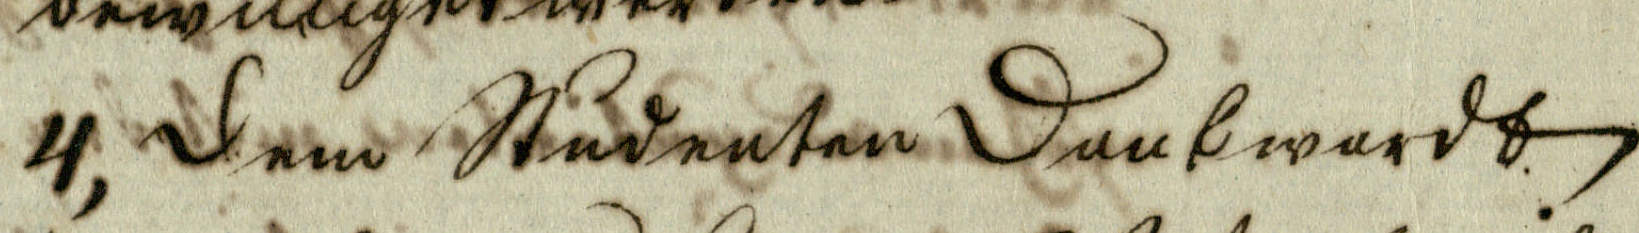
4, Dem Studenten Dankwardt
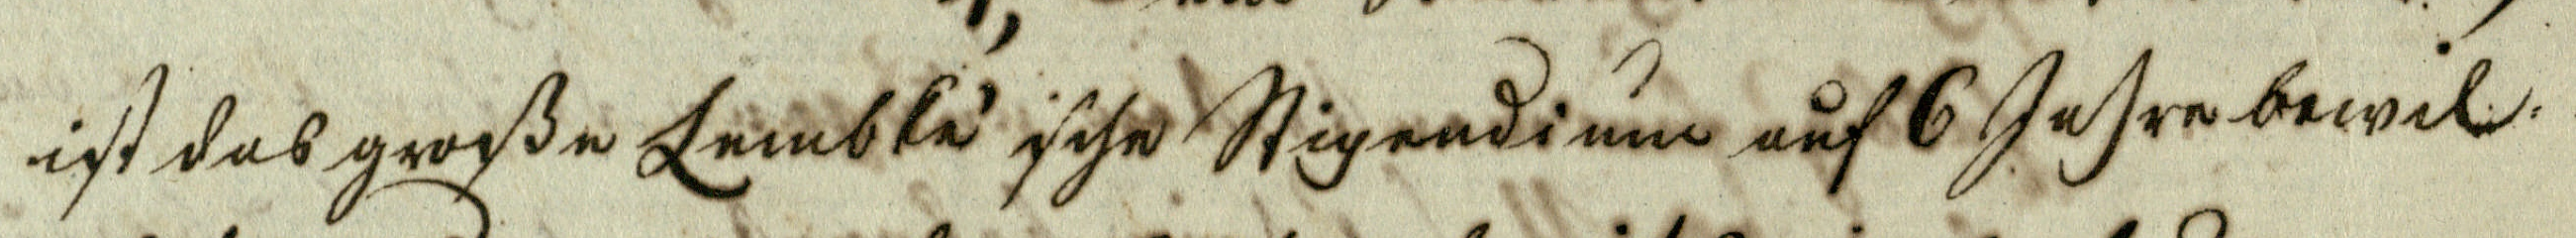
ist das große Lembke'sche Stipendium auf 6 Jahre bewil¬
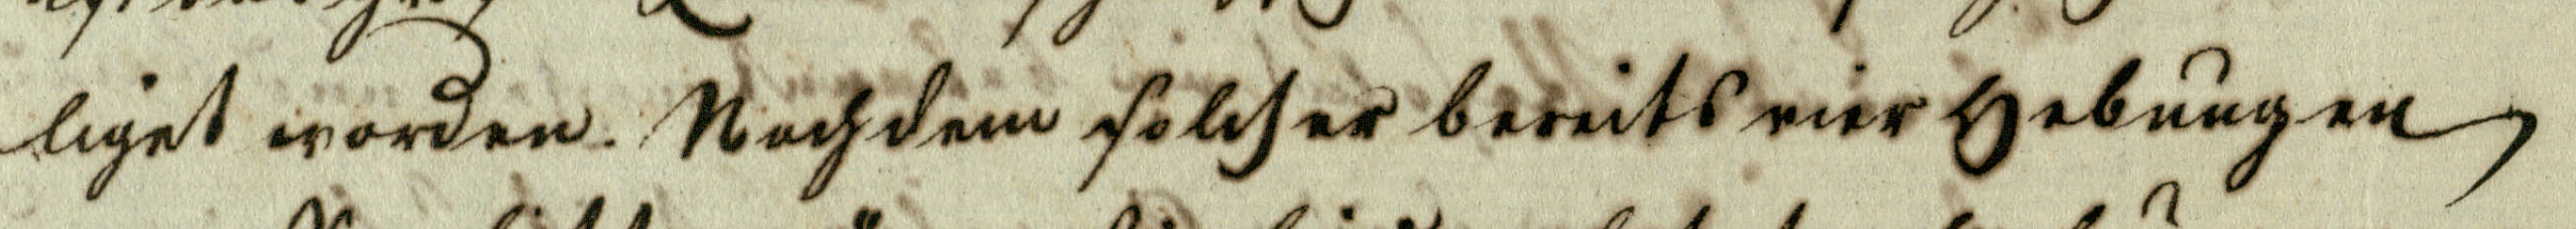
liget worden. Nachdem solcher bereits vier Hebungen
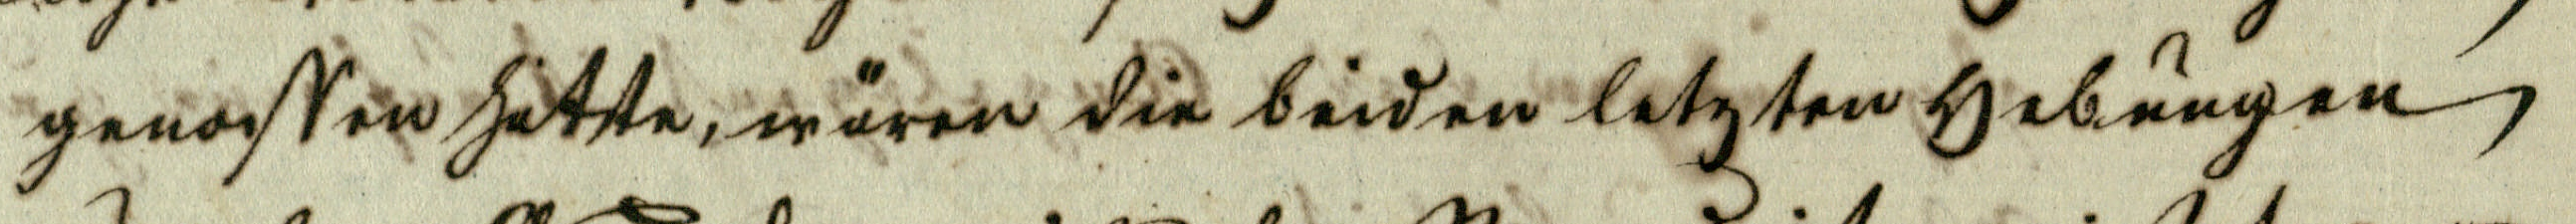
genossen hätte, wären die beiden letzten Hebungen
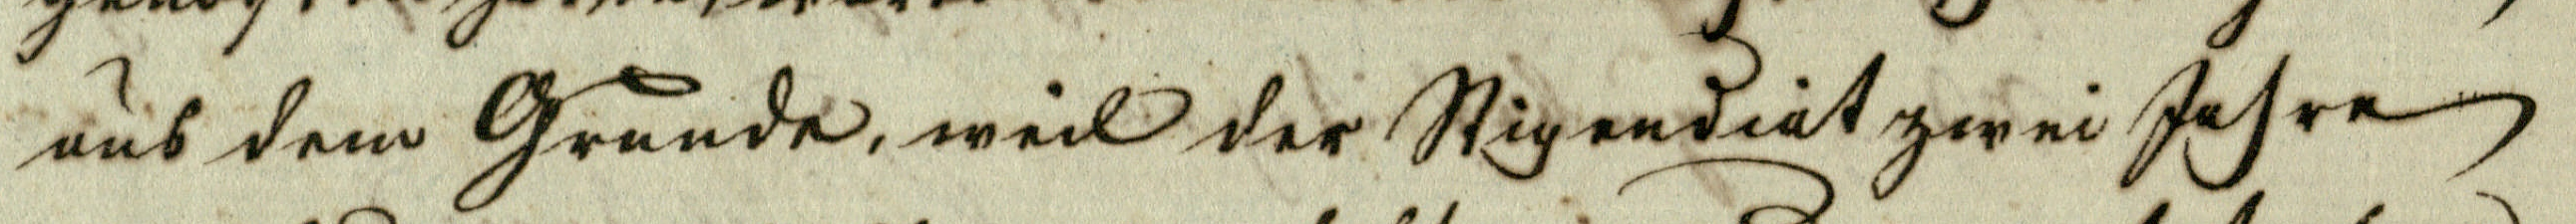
aus dem Grunde, weil der Stipendiat zwei Jahre
